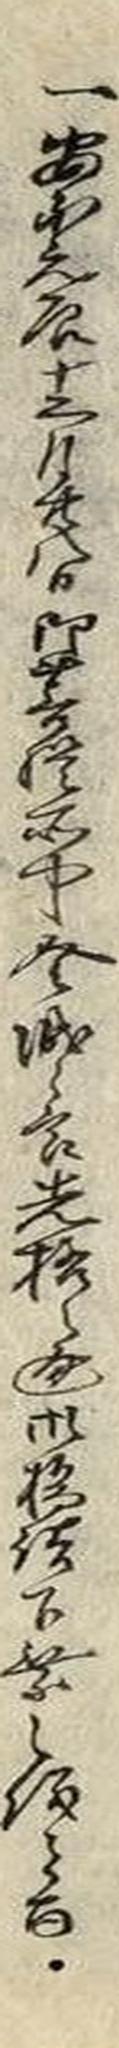一安永元辰十二月廿八日御菩提所中登城之節先格之通御橋詰下乗之儀ニ候而
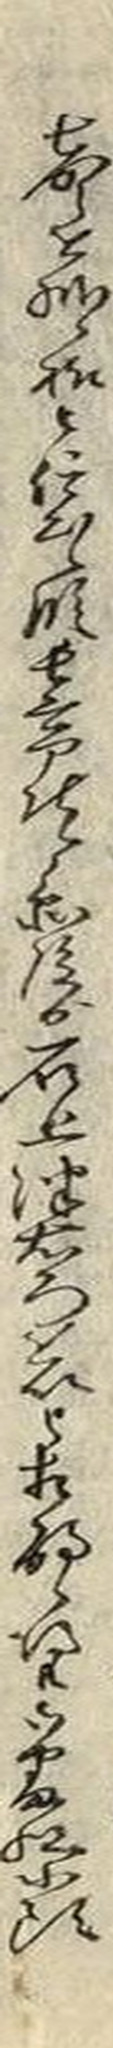声を掛候様被仰出候段長谷部次郎兵衛殿ゟ石上泮右衛門を以被相触候得共御番組小頭
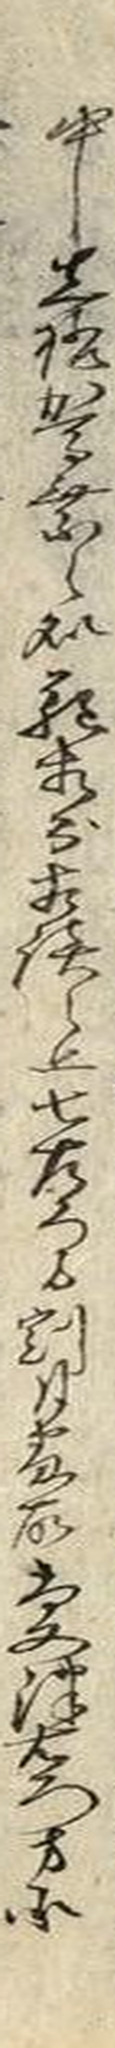中先格駕乗之処難相分相談之上七左衛門方割月番故尚又泮右衛門方承
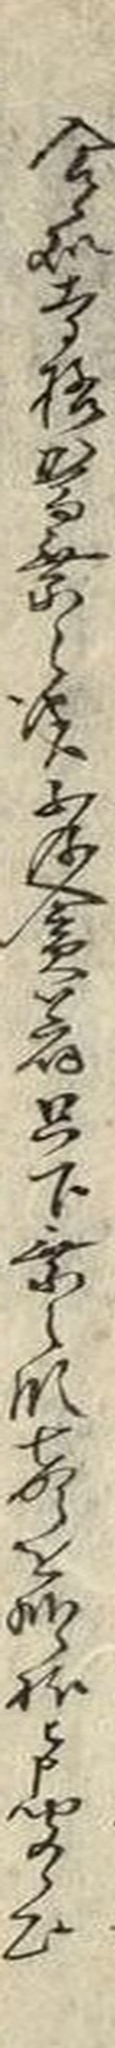合候処寺格駕乗之儀ハ不及貪着只下乗之段声を掛候様被申聞候以上
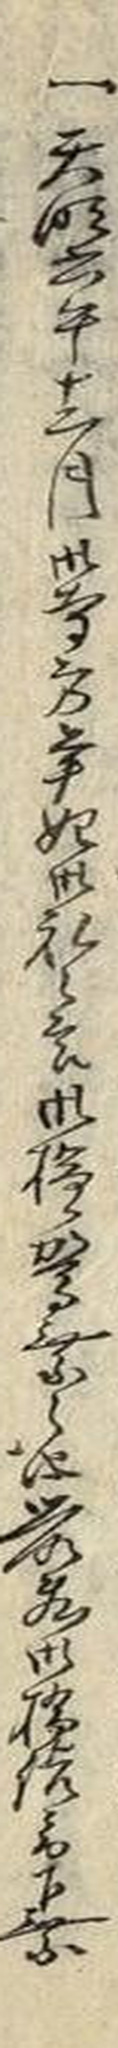一天明六午十二月御寺方年始御礼之節御橋へ駕乗之儀厳敷御橋詰ニ而下乗
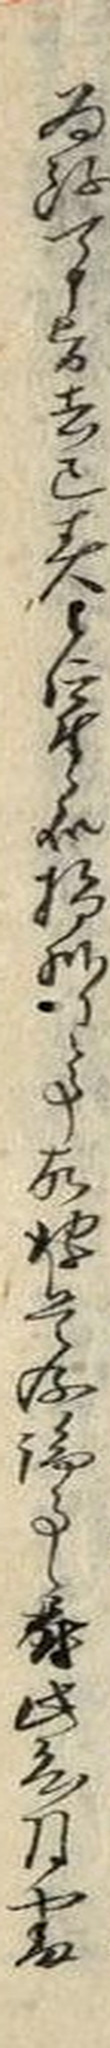為致可申旨去巳春被仰付候処橋掛り候事故彼是論事ニ付此度月番

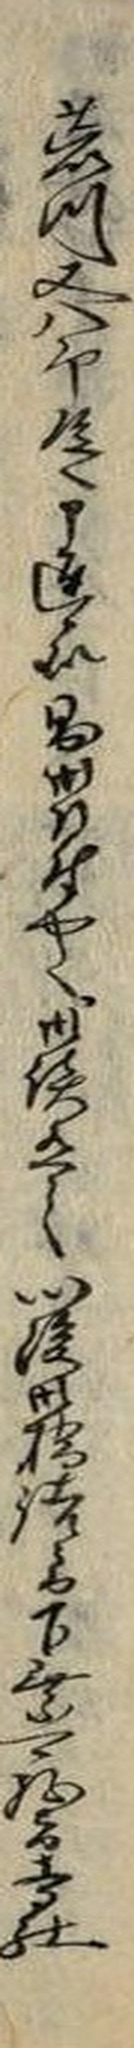荒川又八郎殿へ申達候処則御目付中へ御談有之以後御橋詰ニ而下乗可致旨寺社
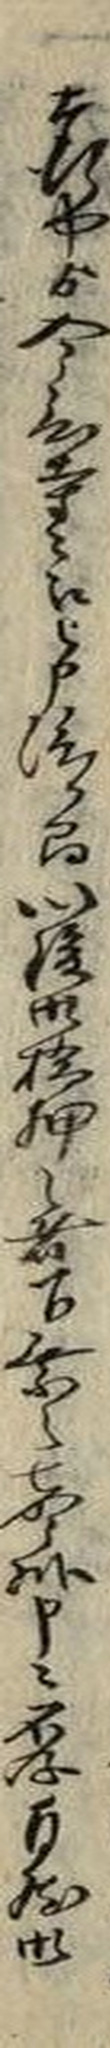奉行中ゟ今度寺々江申渡候間以後御橋押之者下乗之声掛申ニ不及自然御
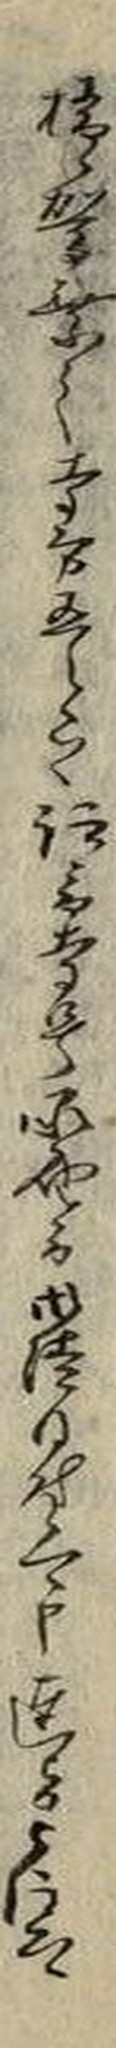橋へ駕乗之寺方有之候ハヽ跡ニ而寺号承届候而御徒目付へ可申達旨被仰出候
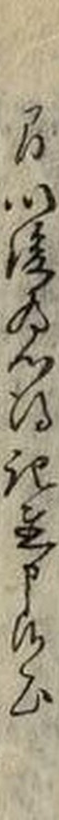間以後為心得記置申候以上
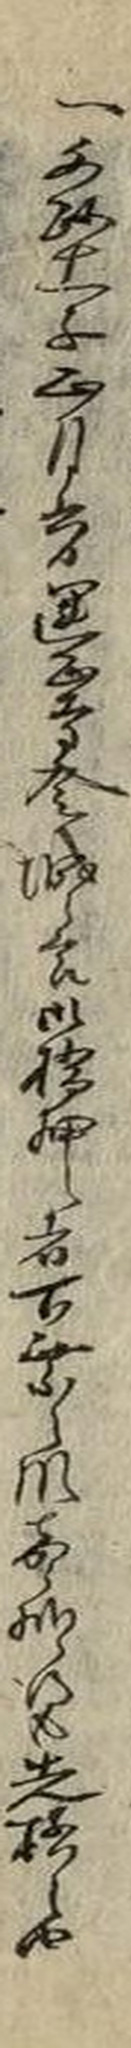一文政十一子正月六日運正寺登城之節御橋押之者下乗之段声掛候得共先格之由
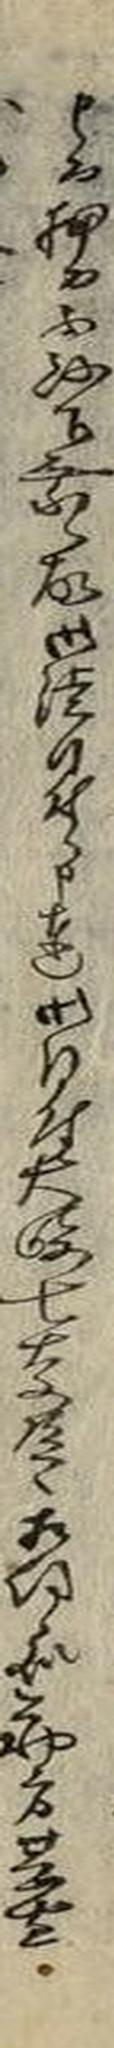申候而押而不致下乗候故御徒目付へ申達御目付大崎七太夫殿へ相伺候処勤方甚宜
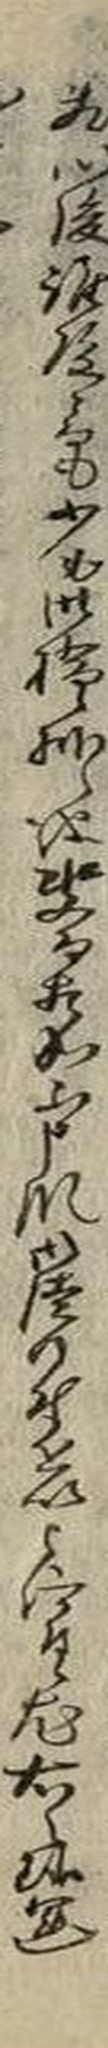敷以後誰殿ニ而も少も御橋掛候儀決而相成不申段御徒目付を以被仰付候尤右之趣運
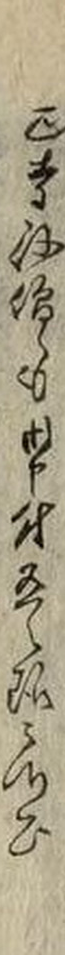正寺役僧へも御申付有之候趣ニ候以上
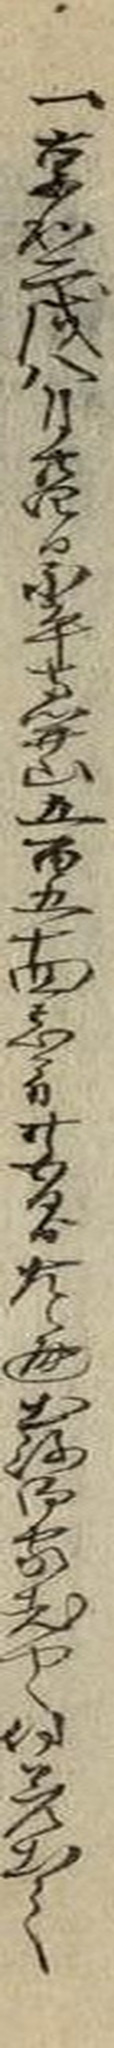一享和二戌八月廿四日永平寺開山五百五十回忌ニ付廿五日ゟ左之通出役御家老中へ伺差出之
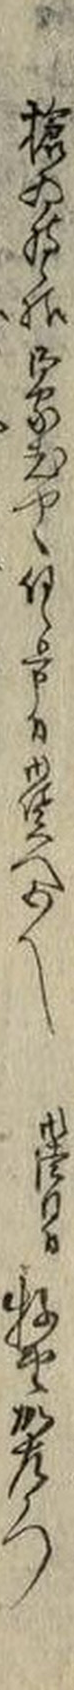槍為持候様御家老中へ伺之上申付御貸人五人御徒目付牧野加左衛門
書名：御国他国諸事之部
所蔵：福井県文書館 Fukui Prefectural Archives
